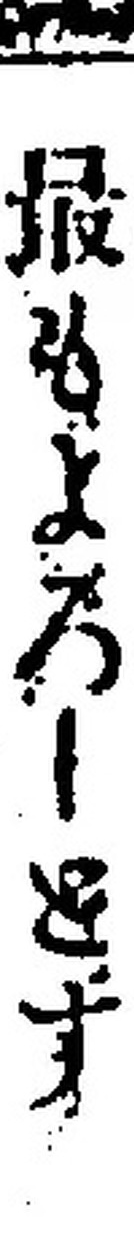最もよろしとす
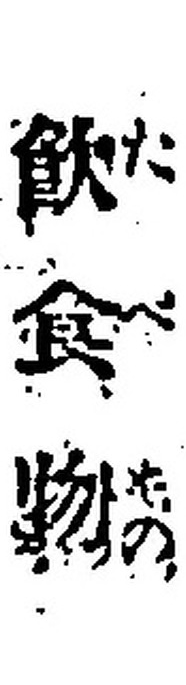飲食物
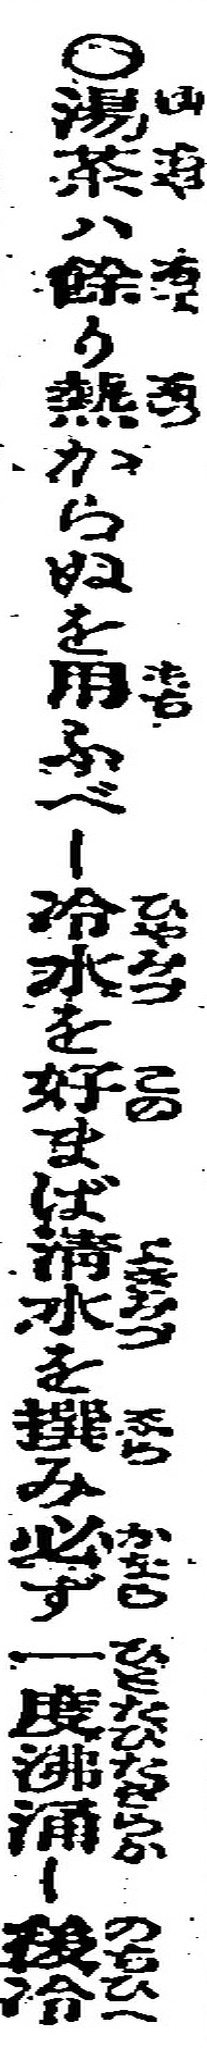○湯茶は餘り熱からぬを用ふべし冷水を好まば清水を撰み必ず一度沸涌し後冷
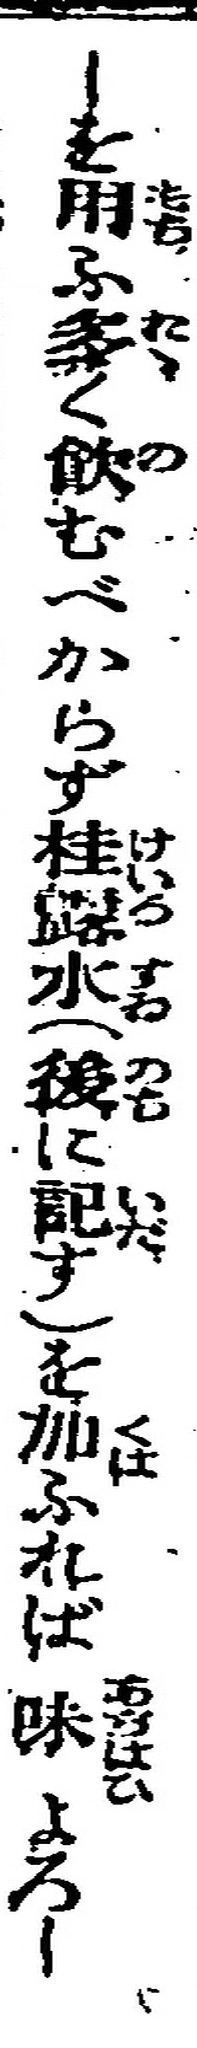しを用ふ多く飲むべからず桂露水[後に記す]を加ふれば味よろし
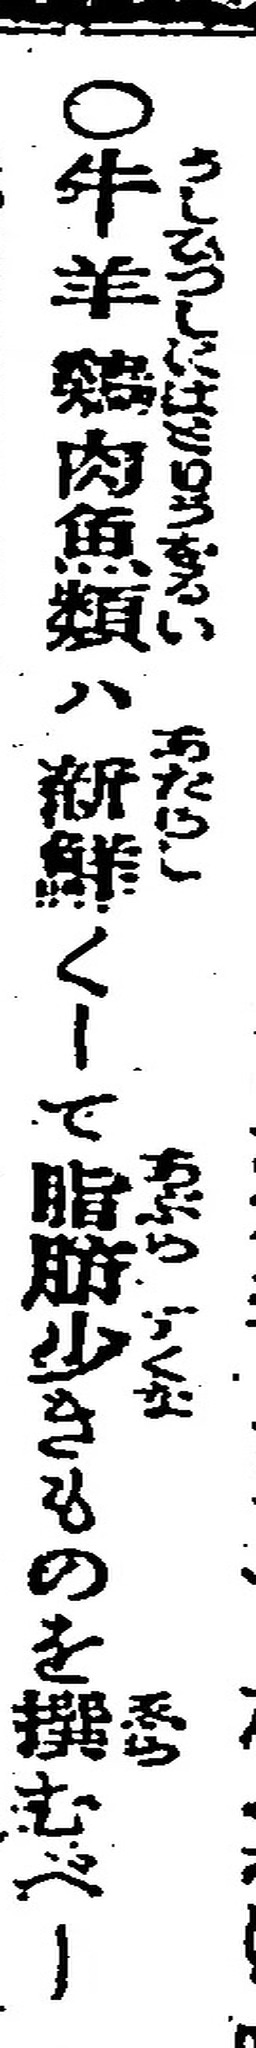〇牛羊鶏肉魚類は新鮮くして脂肪少きものを撰むべし
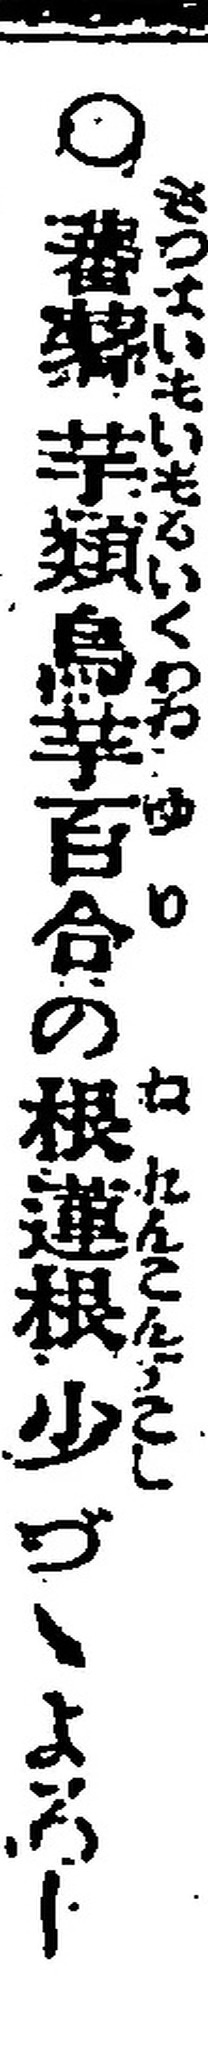〇蕃藷芋類烏芋百合の根蓮根少づゝよろし
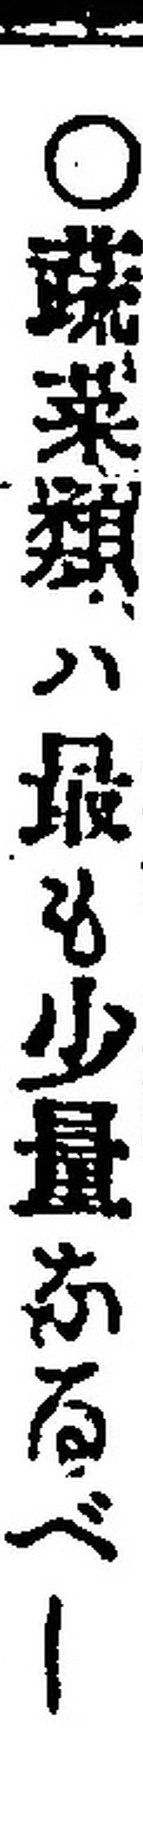〇蔬菜類は最も少量なるべし
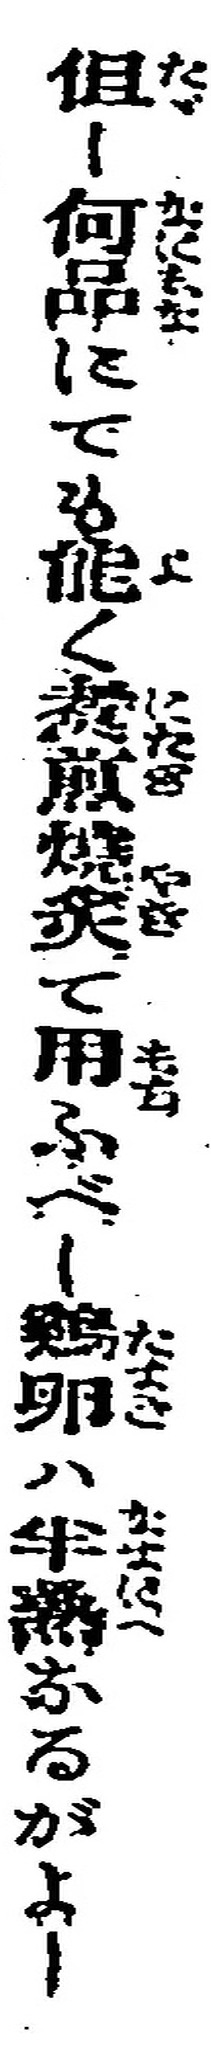但し何品にても能く煑煎焼炙て用ふべし鶏卵は半熟なるがよし
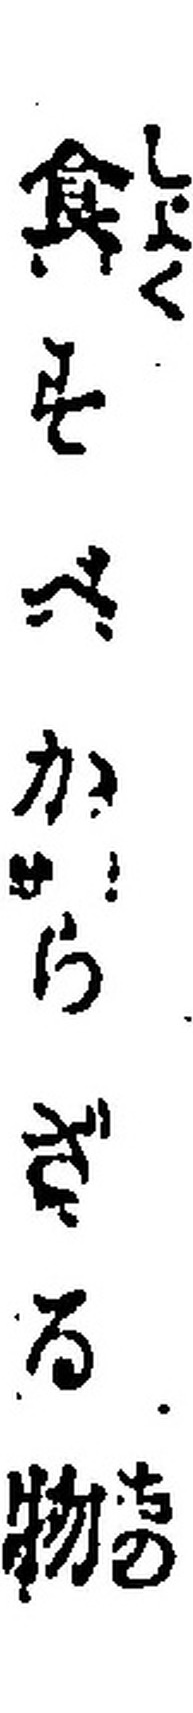食すべからざる物
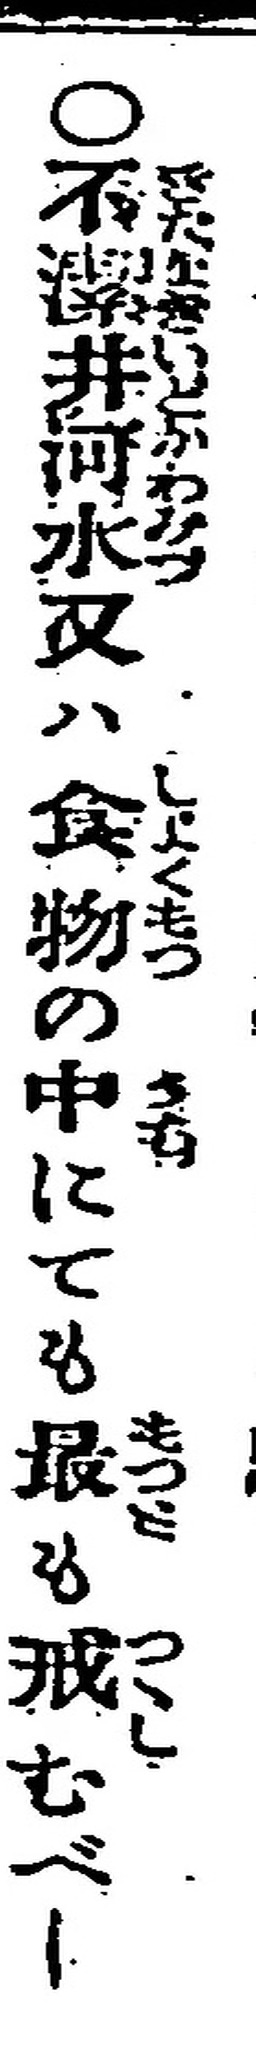〇不潔井河水又は食物の中にても最も戒むべし
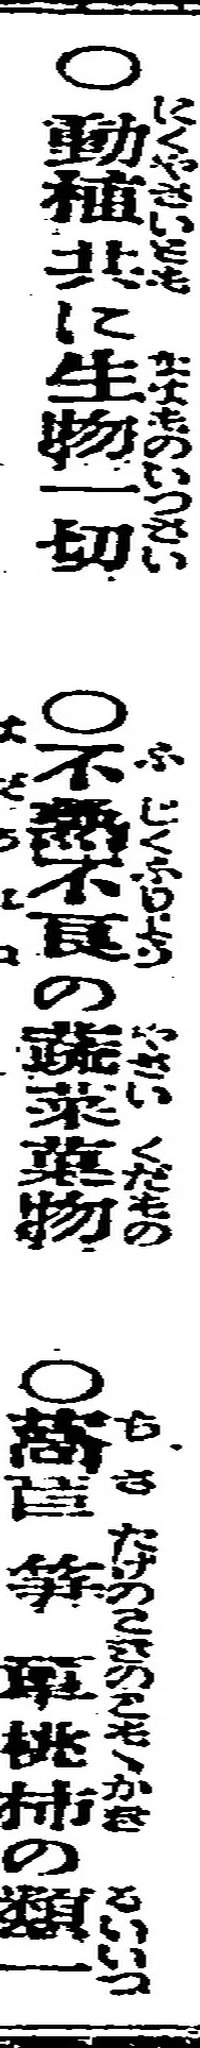〇動植共に生物一切〇不熟不良の蔬菜果物〇蕎苣笋茸桃柿の類一
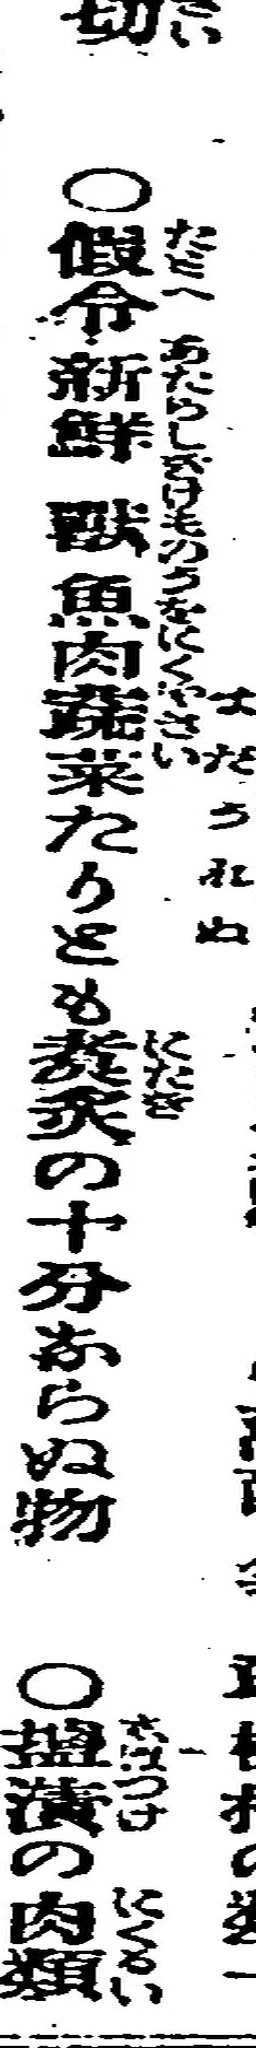切〇假令新鮮獣魚肉蔬菜たりとも煑炙の十分ならぬ物〇䀋漬の肉類
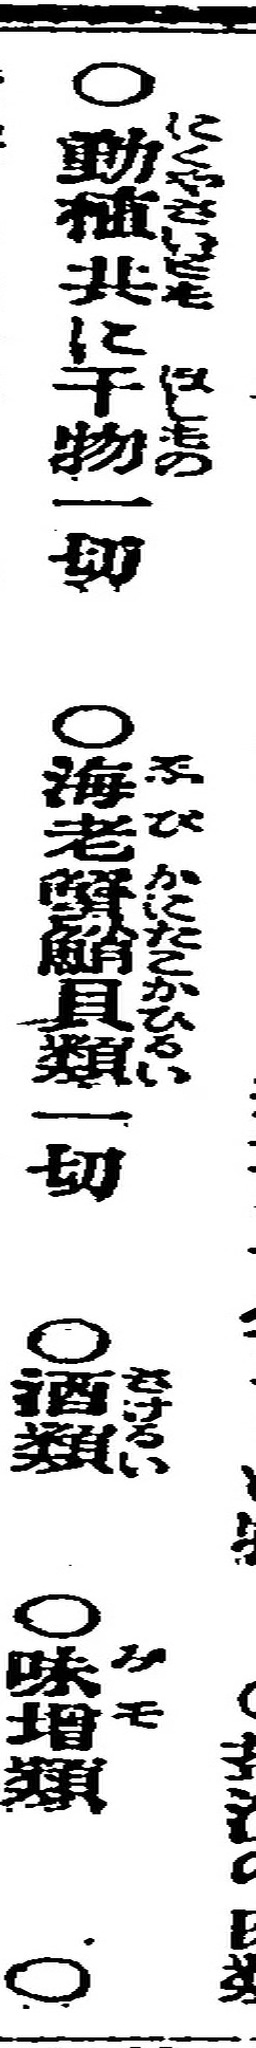〇動植共に干物一切〇海老蟹蛸貝類一切〇酒類〇味噌類〇
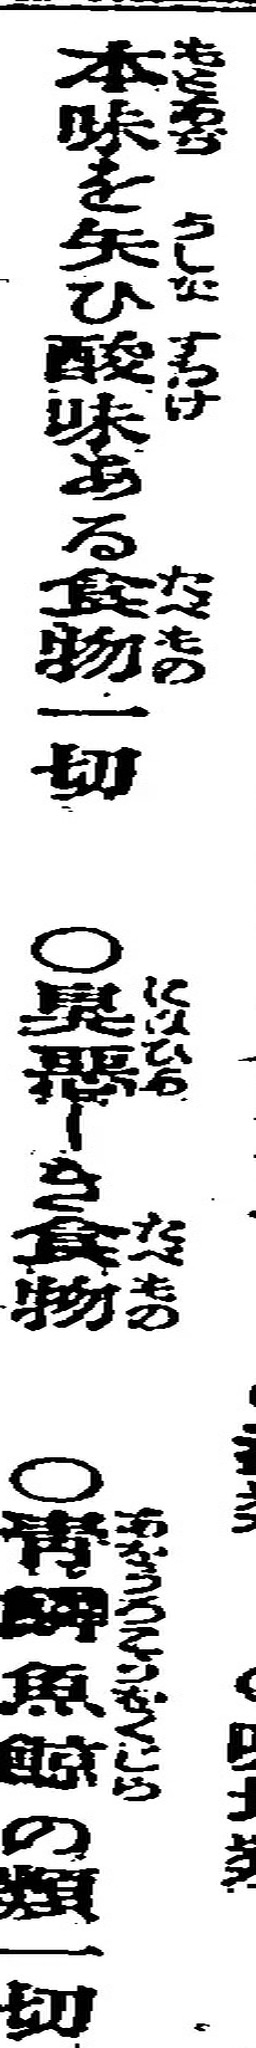本味を失ひ酸味ある食物一切〇臭惡しき食物〇青鱗鱗魚鯨の類一切

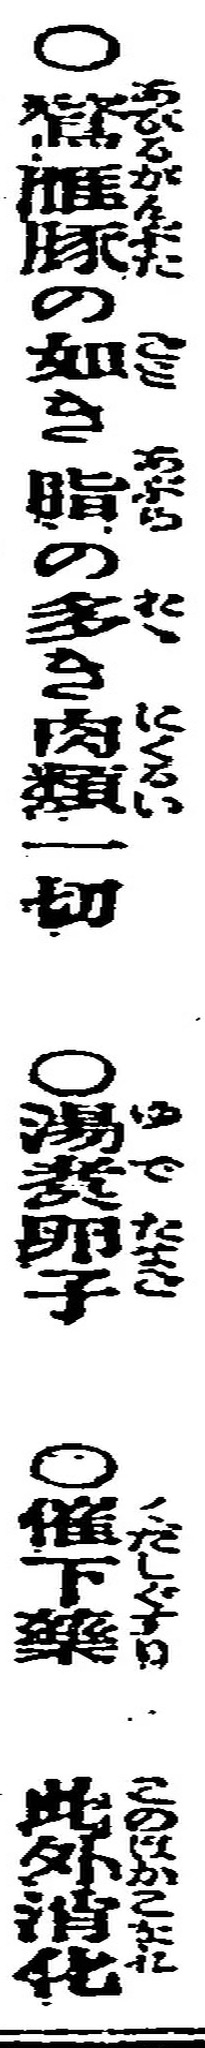〇鶩雁豚の如き脂の多き肉類一切〇湯煑卵子〇催下薬此外消化
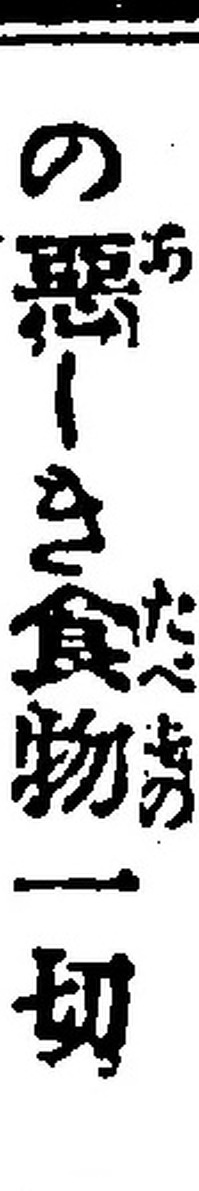の惡しき食物一切
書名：虎列剌病予防養生法訳解
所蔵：国立国会図書館 National Diet Library, JAPAN
